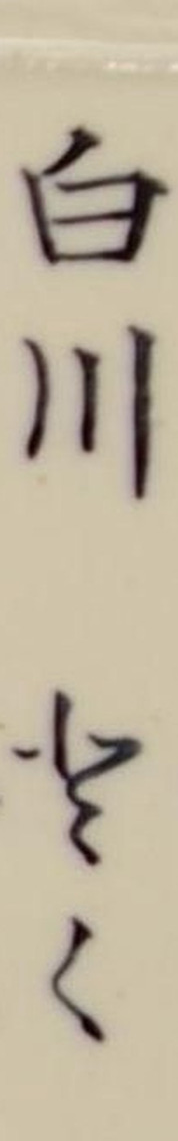白川とく
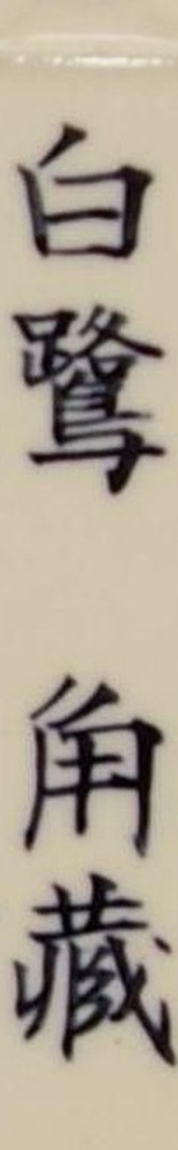白鷺角蔵
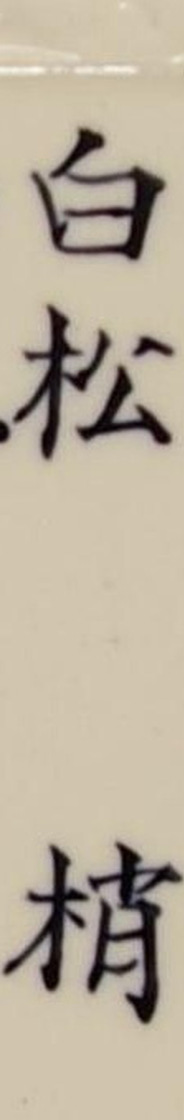白松梢
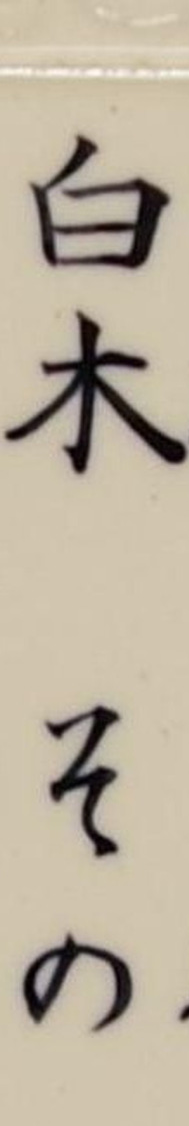白木その
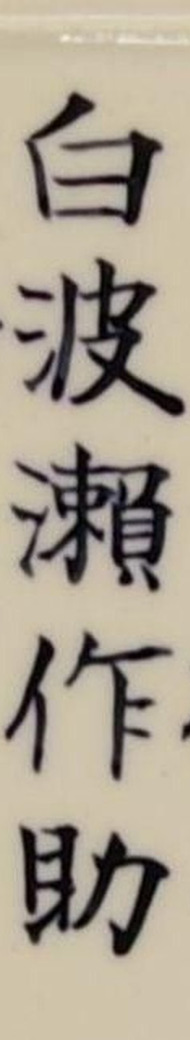白波瀬作助
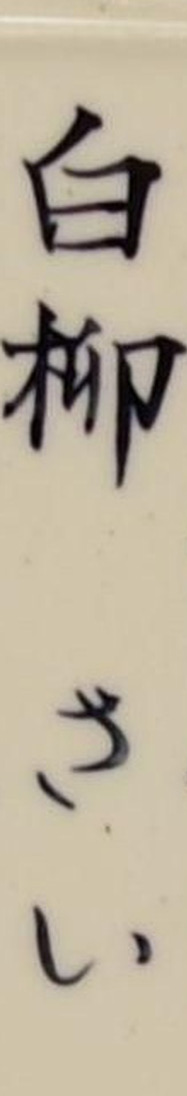白柳さい
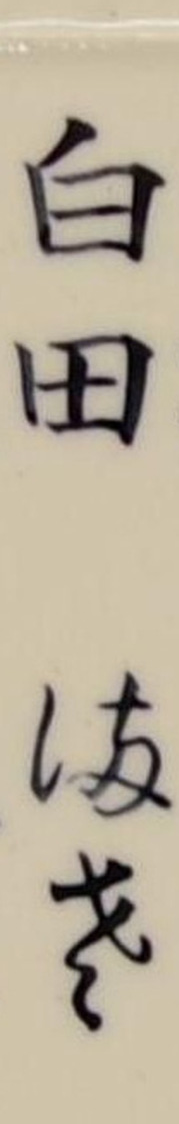白田まさ
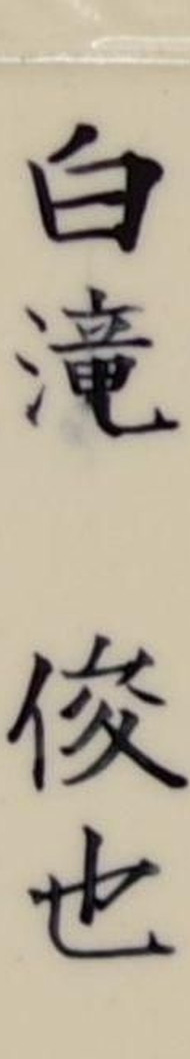白滝俊也
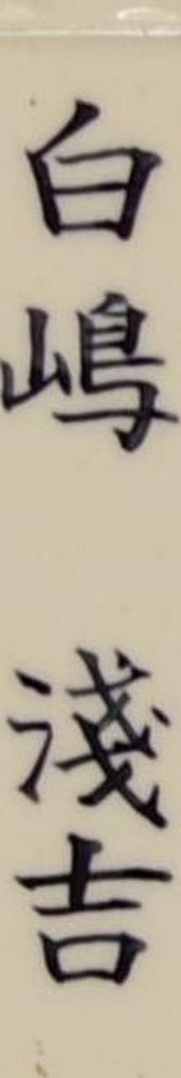白嶋浅吉
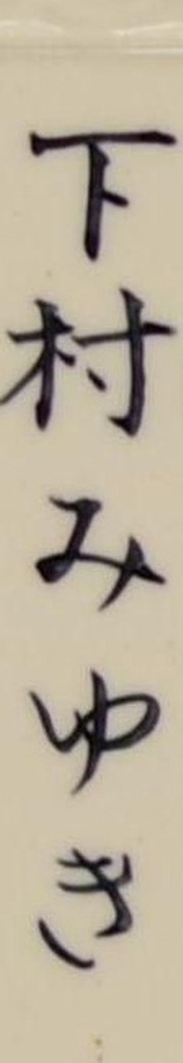下村みゆき
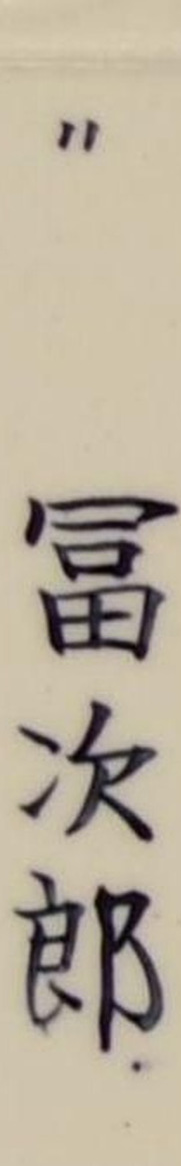冨次郎
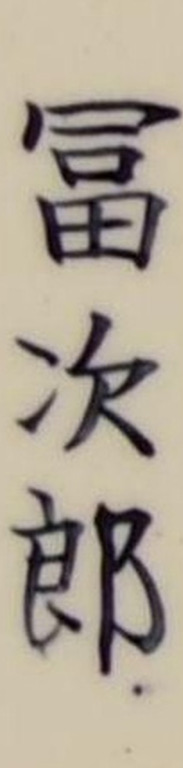冨次郎

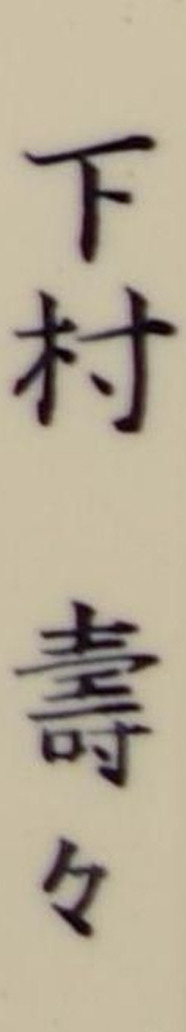下村壽々
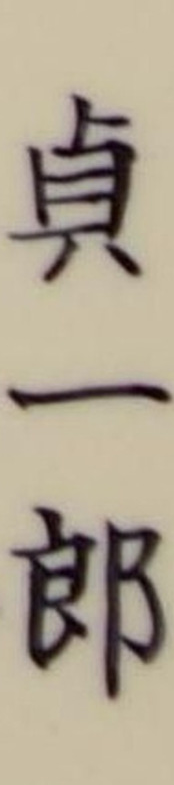貞一郎
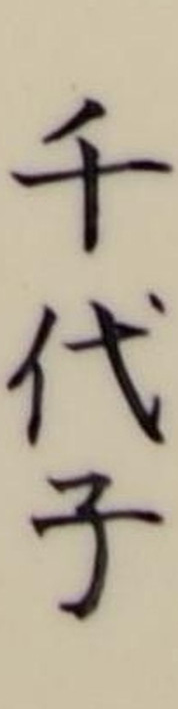千代子
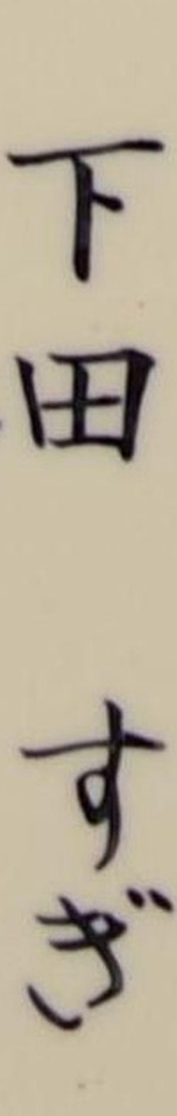下田すぎ
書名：A~D
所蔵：koyasan kongobuji
